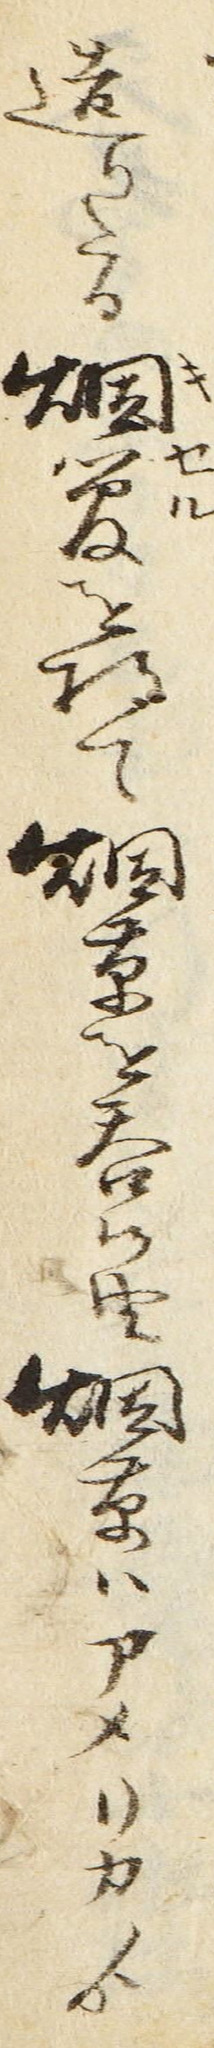造りたる烟管を持て烟草を呑候由烟草ハアメリカゟ

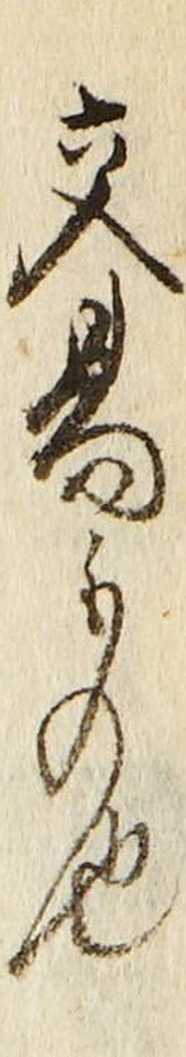交易もの也
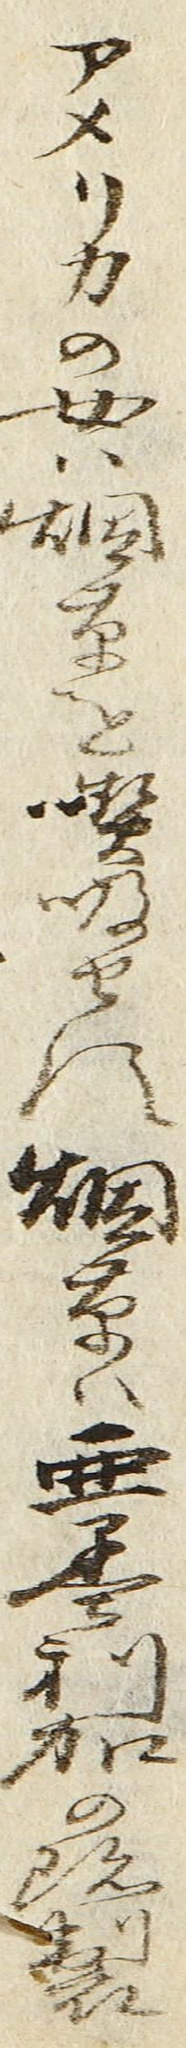アメリカの女ハ烟草を喫吸せす烟草ハ亜墨利加の既製
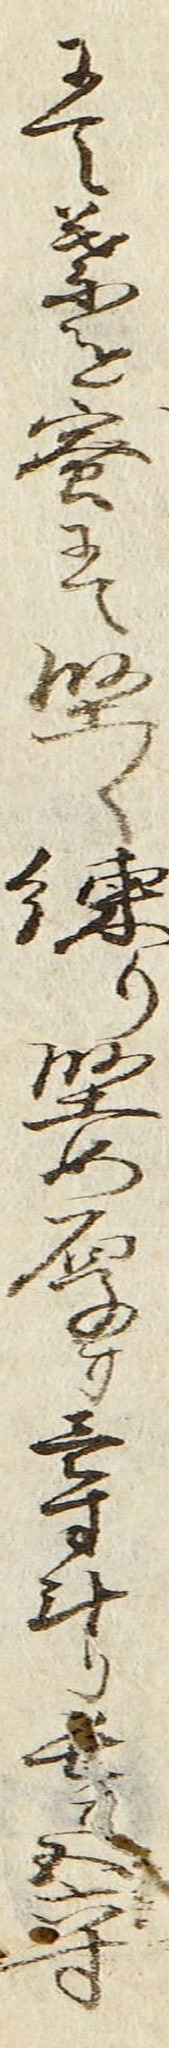にて葉を蜜にて堅く練り堅め厚サ壱寸計り長サ五六寸
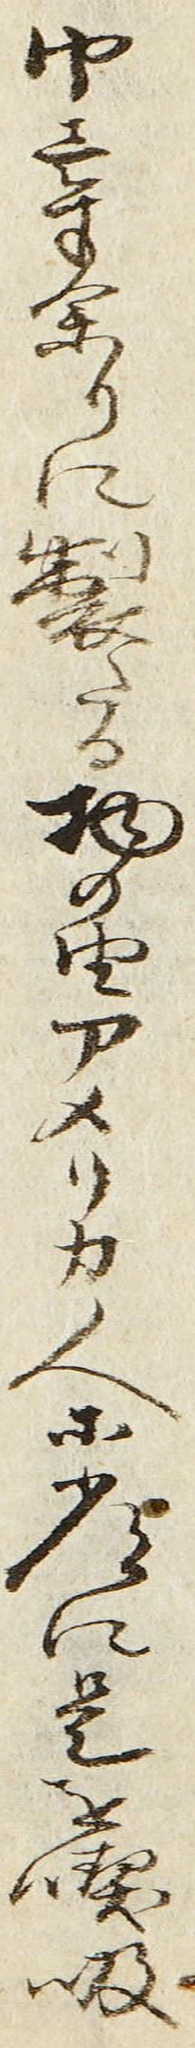巾壱寸余りに製たる物の由アメリカ人等常に是を喫吸
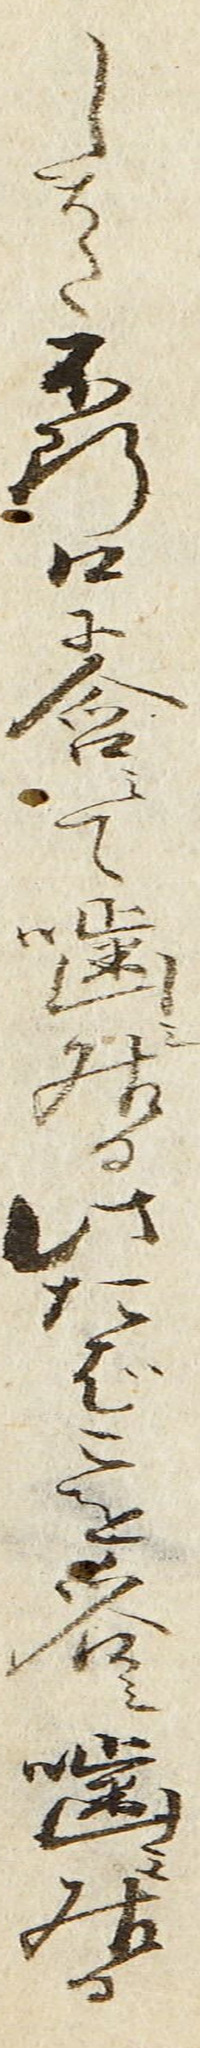しまた不断口に含ミて噛ミ居る此たばこをミ噛ミ居る
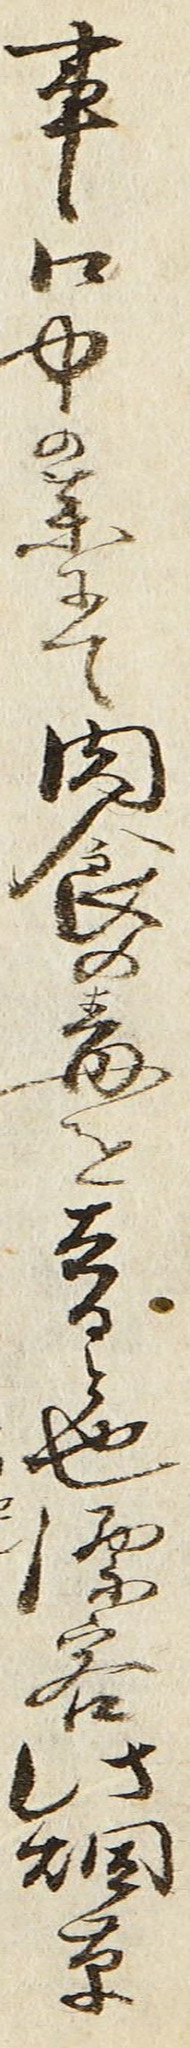事口中の薬にて肉食の毒を去ると也漂客此烟草
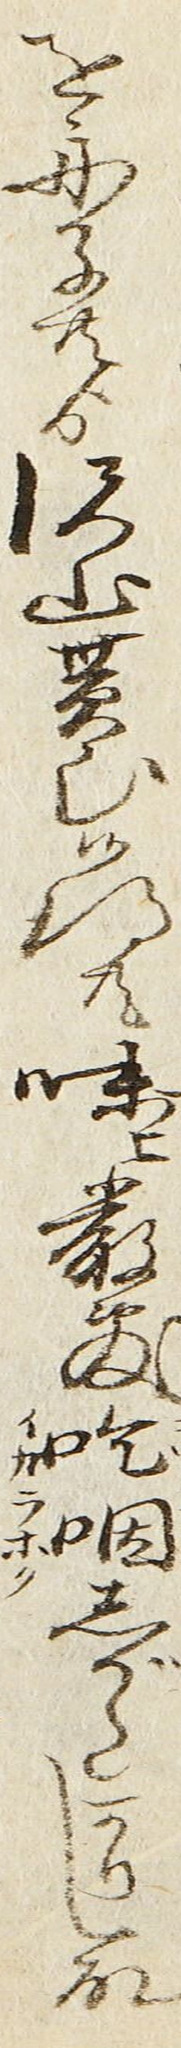を舟子共ゟ沢山貰ひ候得共味ヒ厳敷吃咽しがたかりし故
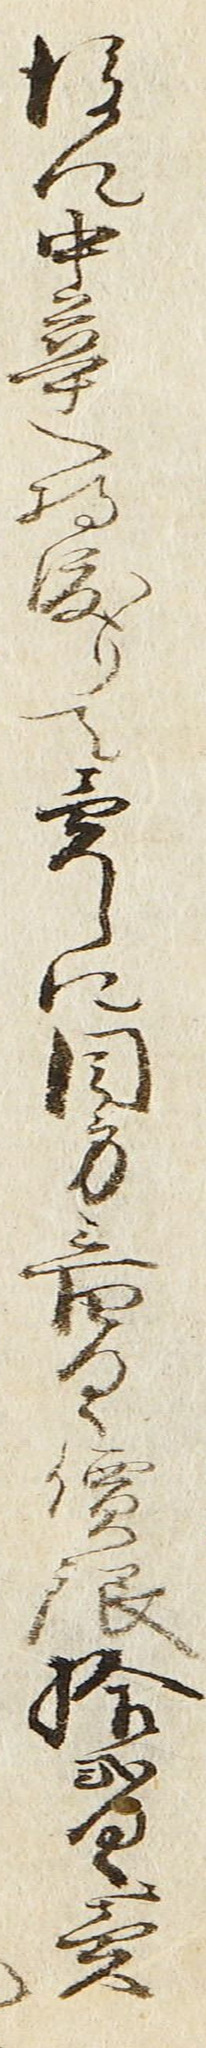後に中華へ持渡りて売しに目方三百匁価銀拾弐匁ニ売
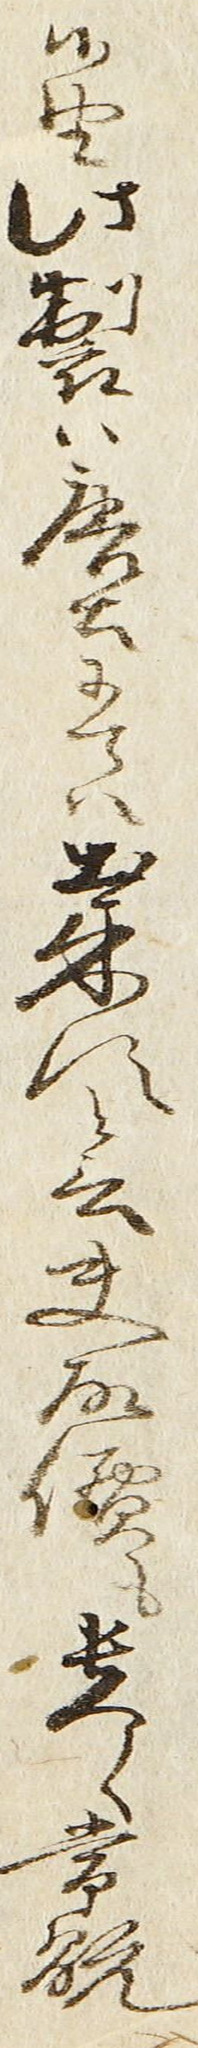候由此製ハ唐土にてハ出来すと云夫故価も貴く常翫
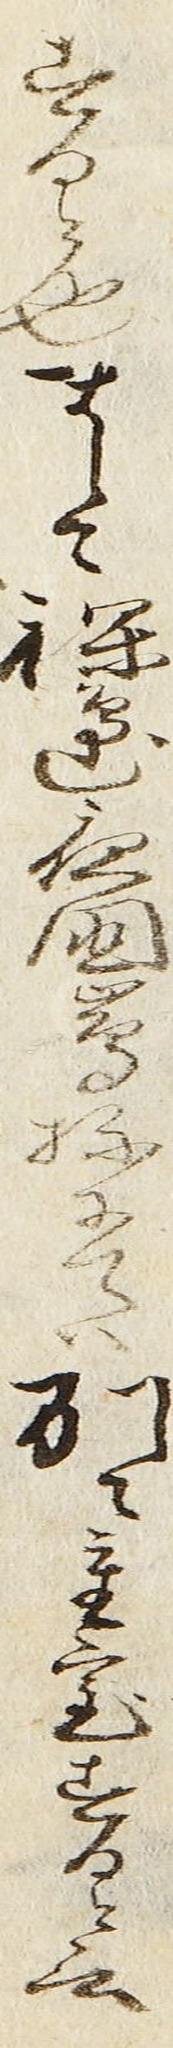すると也まして裸島夜国島抔にてハ別て重宝すると云
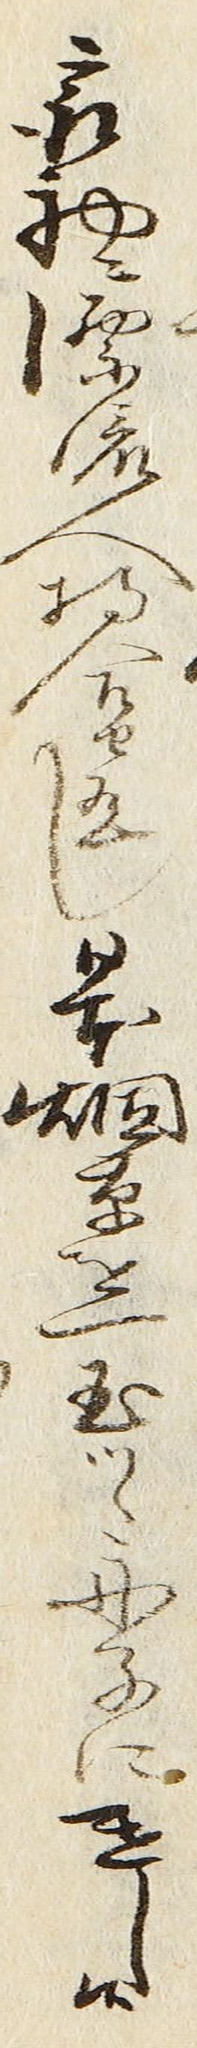最初ニ漂流人持合セ有し日本烟草を一玉ツヽ舟子に遣し候
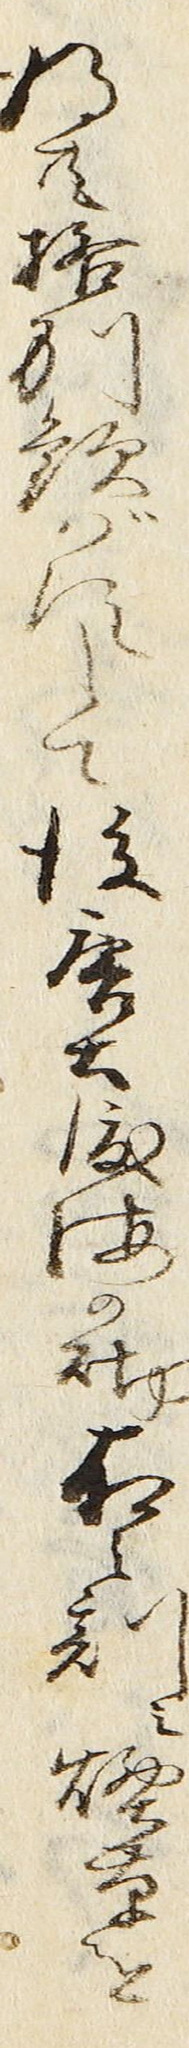得共格別歓バすして後唐土渡海の砌右之刻ミ煙草を
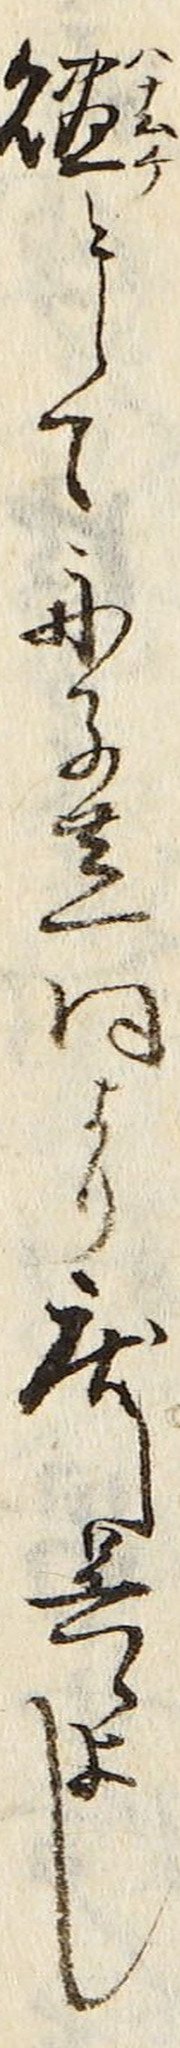贐として舟子共一同より戻し呉候よし
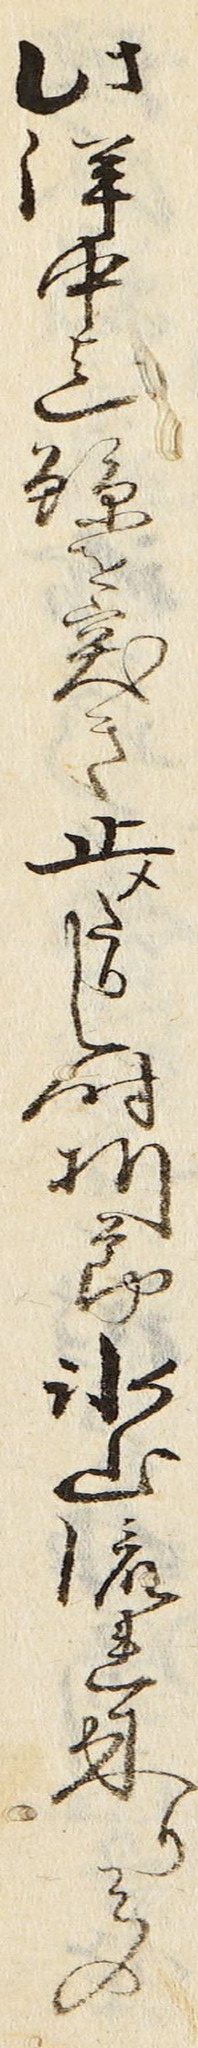此洋中迄鯨を突き止メたりし時折節氷山流れ来りその
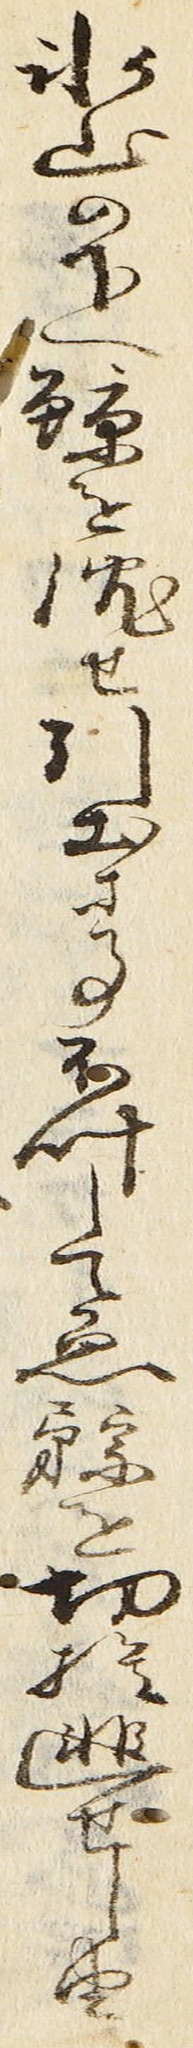氷山の下へ鯨を沈せ引出す事不叶して魚を切捨逃せし由
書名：亜墨利加漂流記聞
